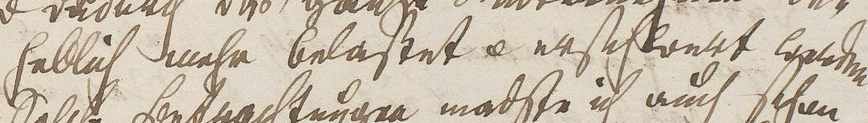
heblich mehr belastet & erschwert werden.
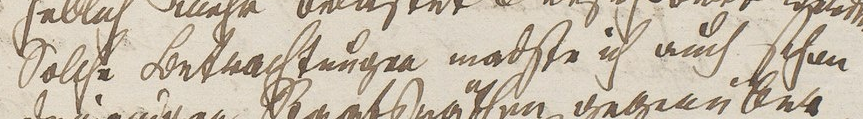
Solche Betrachtungen machte ich auch schon
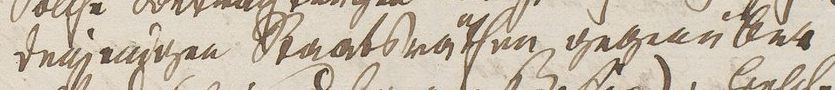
denjenigen Staatsräthen gegenüber
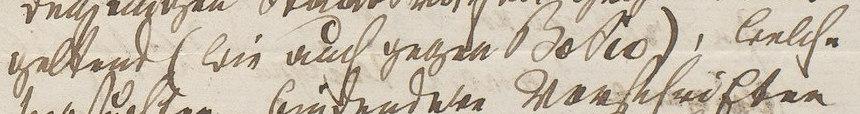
geltend (wie auch gegen Bosio), welche
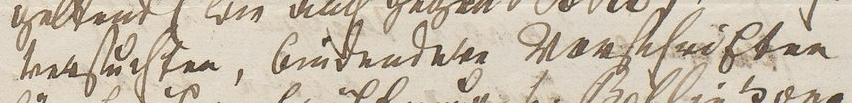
versuchten, bindendere Vorschriften
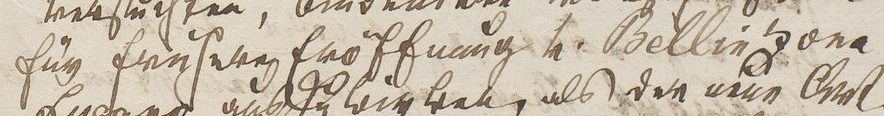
für frühere Eröffnung v. Bellinzona
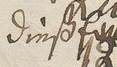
dießfalls
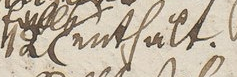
enthält.
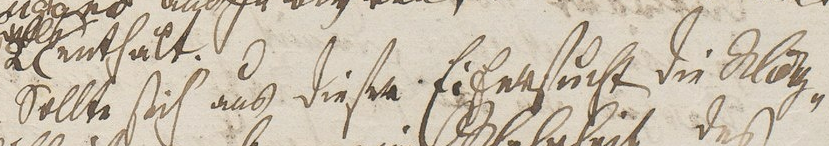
Sollte sich aus dieser Eifersucht die Mög-
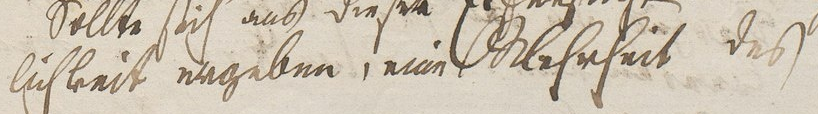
lichkeit ergeben, eine Mehrheit des
